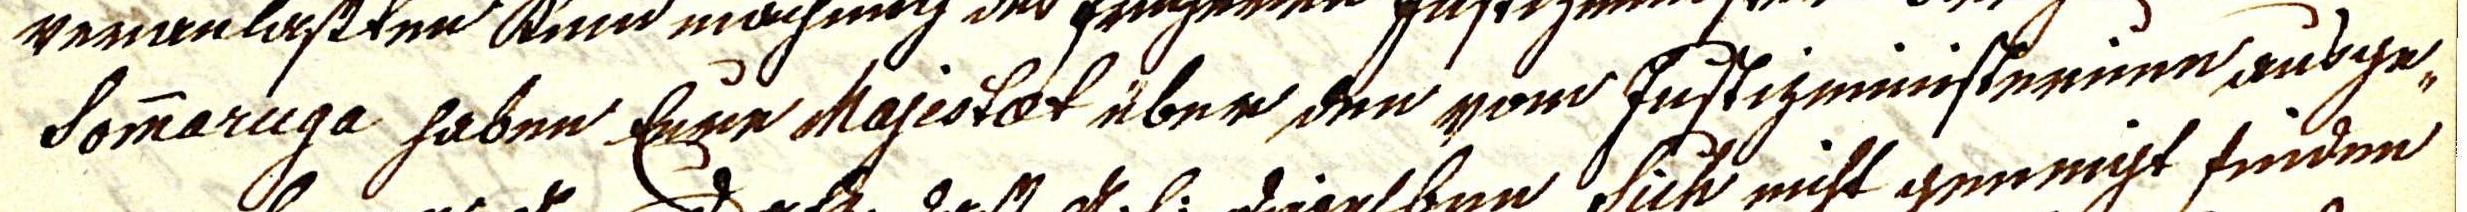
Sommaruga haben Eure Majestæt über den vom Justizministerium ausge¬
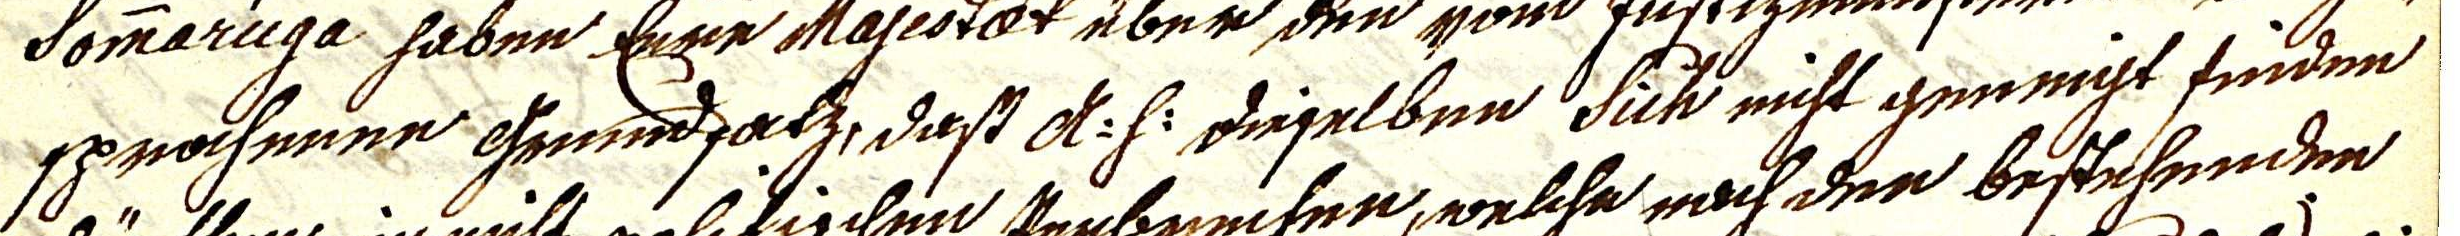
sprochenen Grundsatz, daß A: h: dieselben Sich nicht geneigt finden
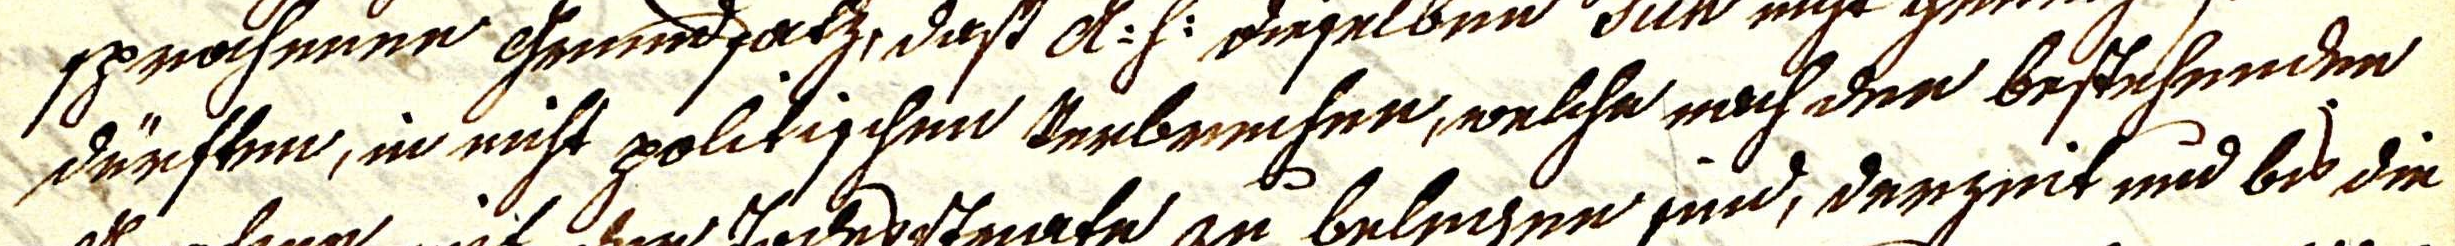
dürften, in nicht politischen Kerbrechen, welche nach den bestehenden
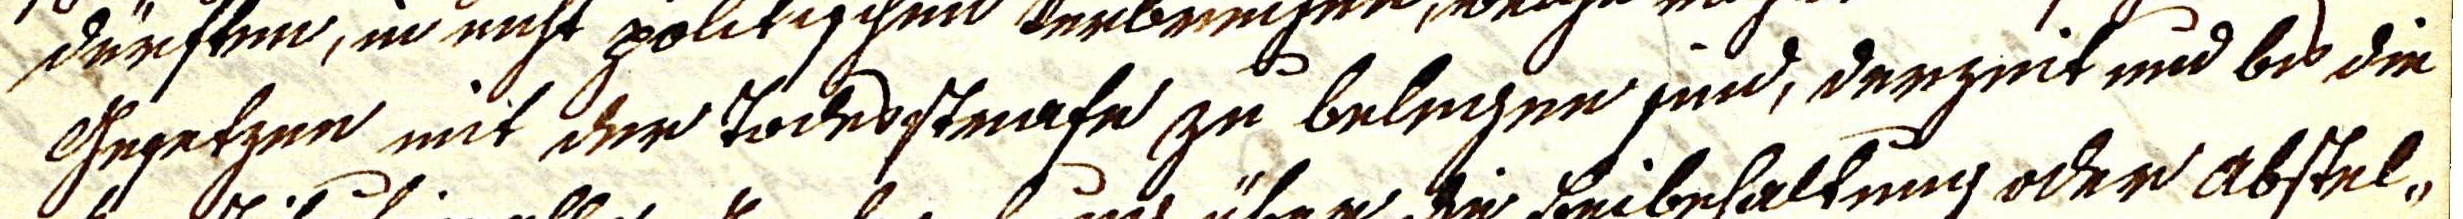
Gesetzen mit der Todesstrafe zu belegen sind, derzeit und bis die
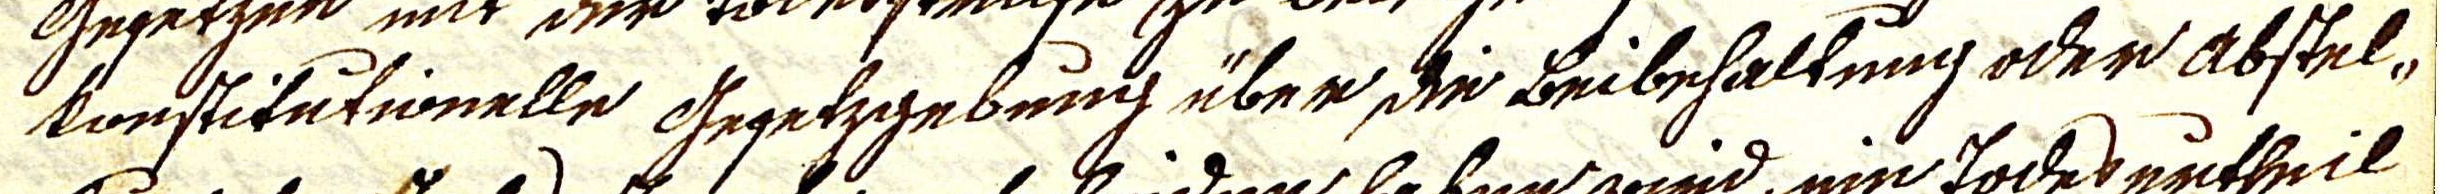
konstitutionelle Gesetzgebung über die Beibehaltung oder Abstel¬
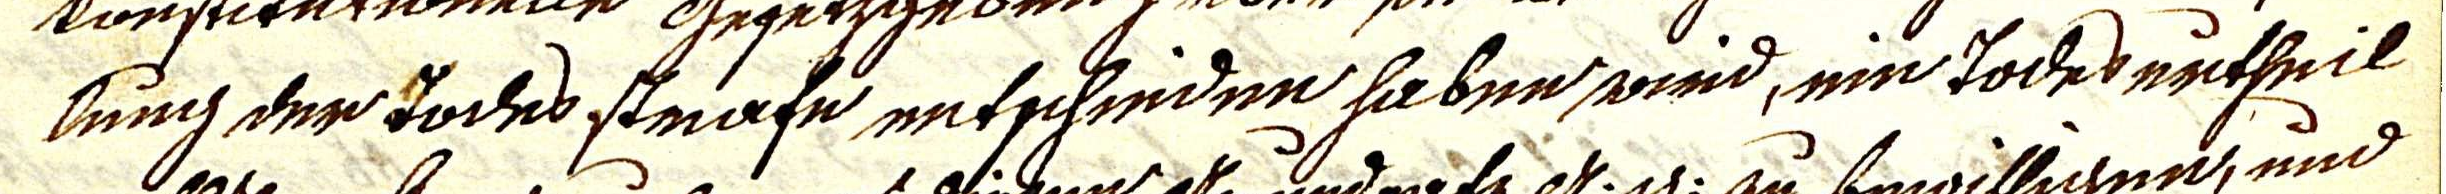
lung der Todes strafe entschieden haben wird, ein Todesurtheil
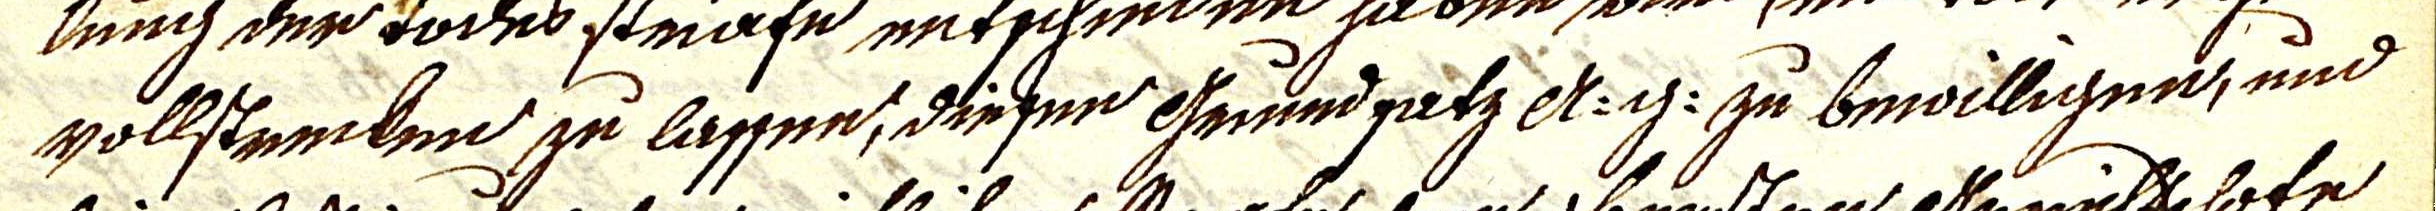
vollstrecken zu lassen, diesen Grundsatz A: g: zu bewilligen, und
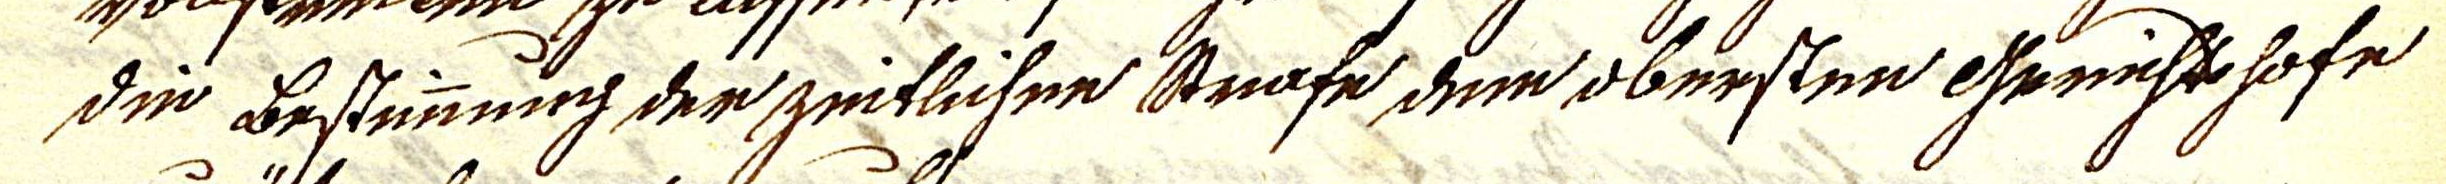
die Bestimmung der zeitlichen Strafe dem obersten Gerichtshofe
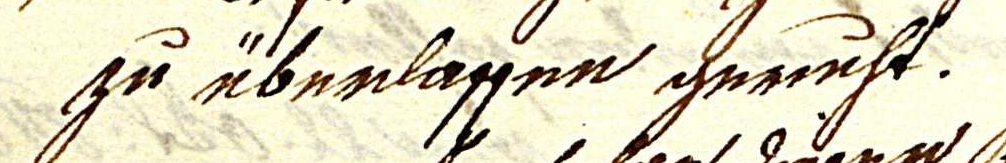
zu überlassen geruht.
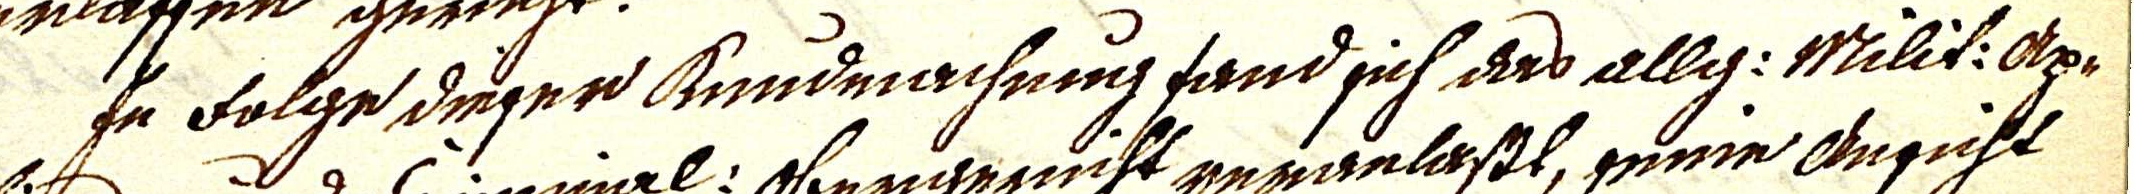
Je Folge dieser Kundmachung fand sich das allg: Milit: Ap¬
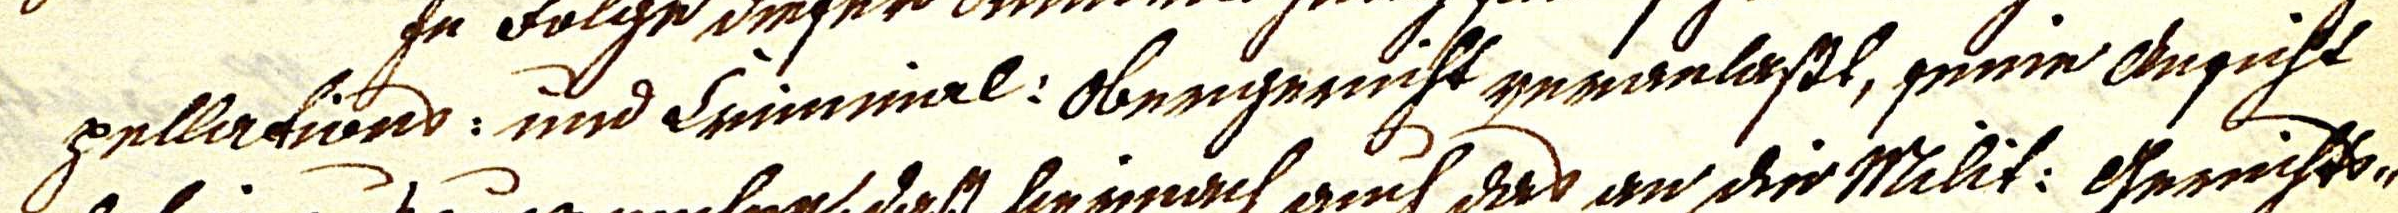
pellations: und Criminal: Obergericht veranlaßt, seine Ansicht
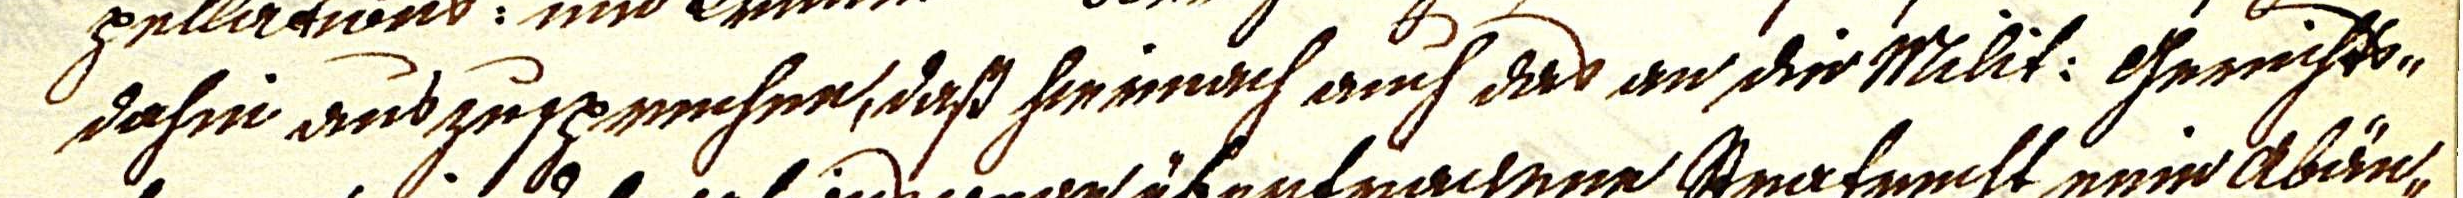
dahin auszusprechen, daß hiernach auch das an die Milit: Gerichts¬
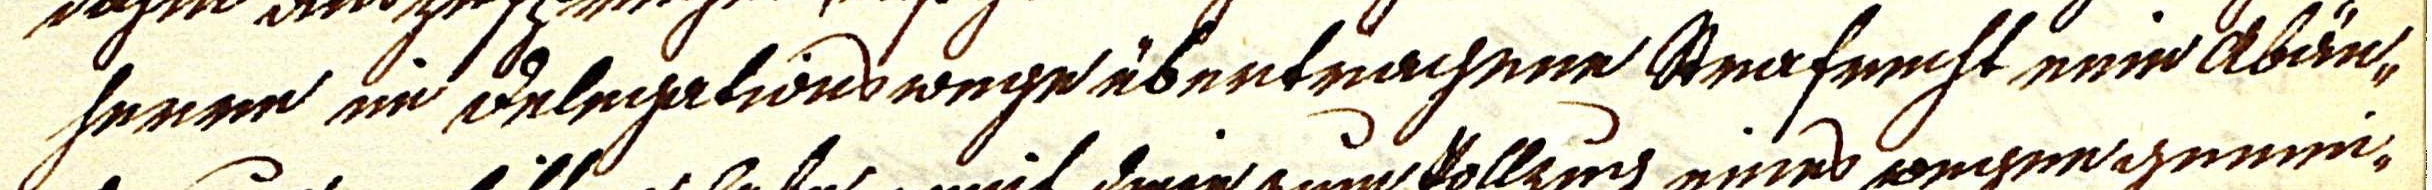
herrn in Delegationswegeübertragene Strafrecht eine Abän¬
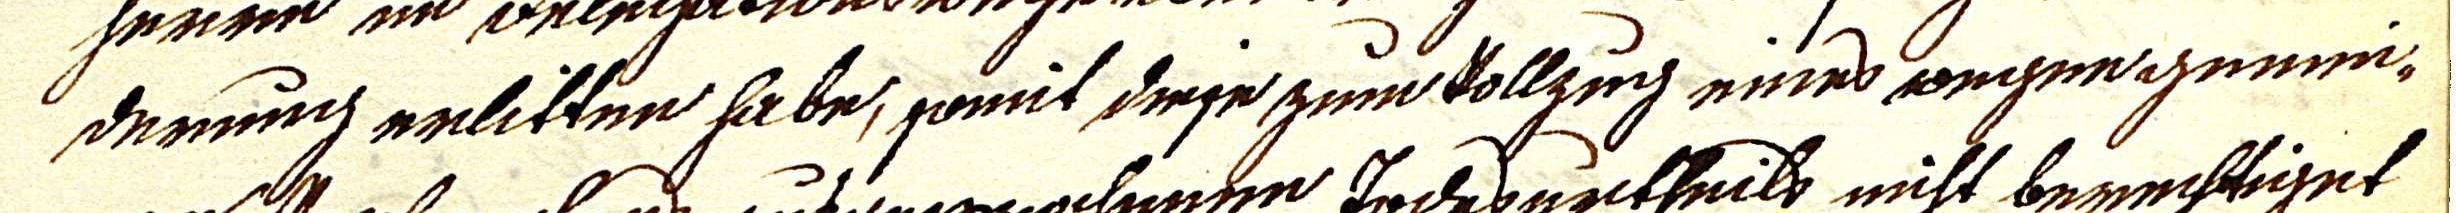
derung erlitten habe, somit diese zum Vollzug eines wegen gemei¬
